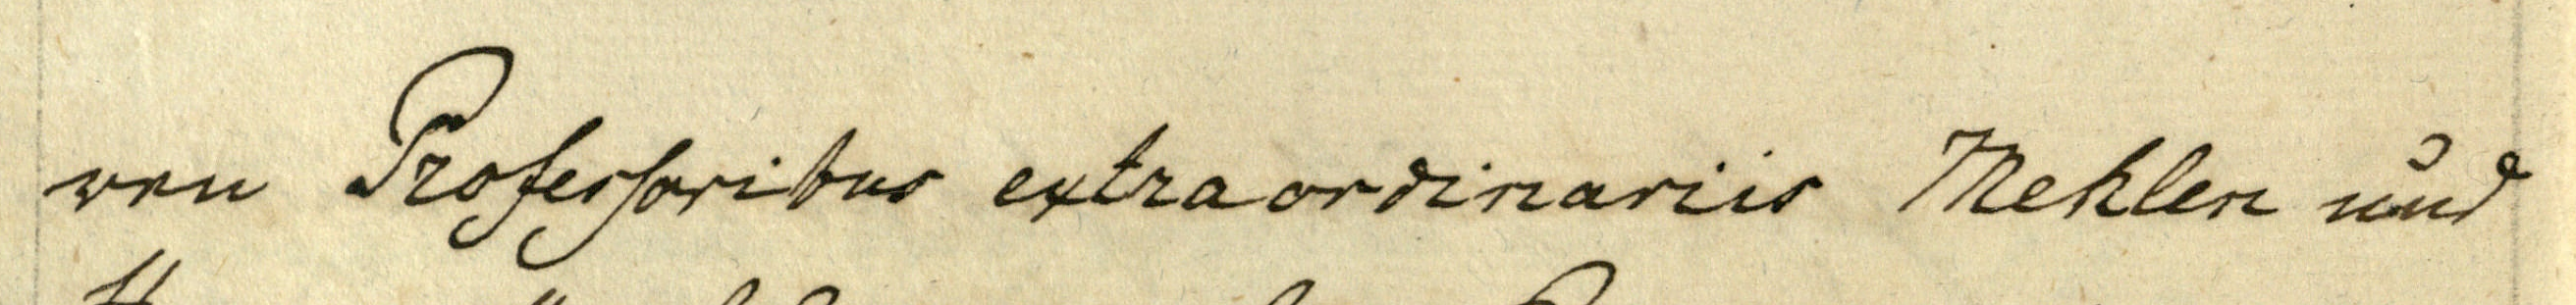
ren Professoribus extraordinariis Mehlen und
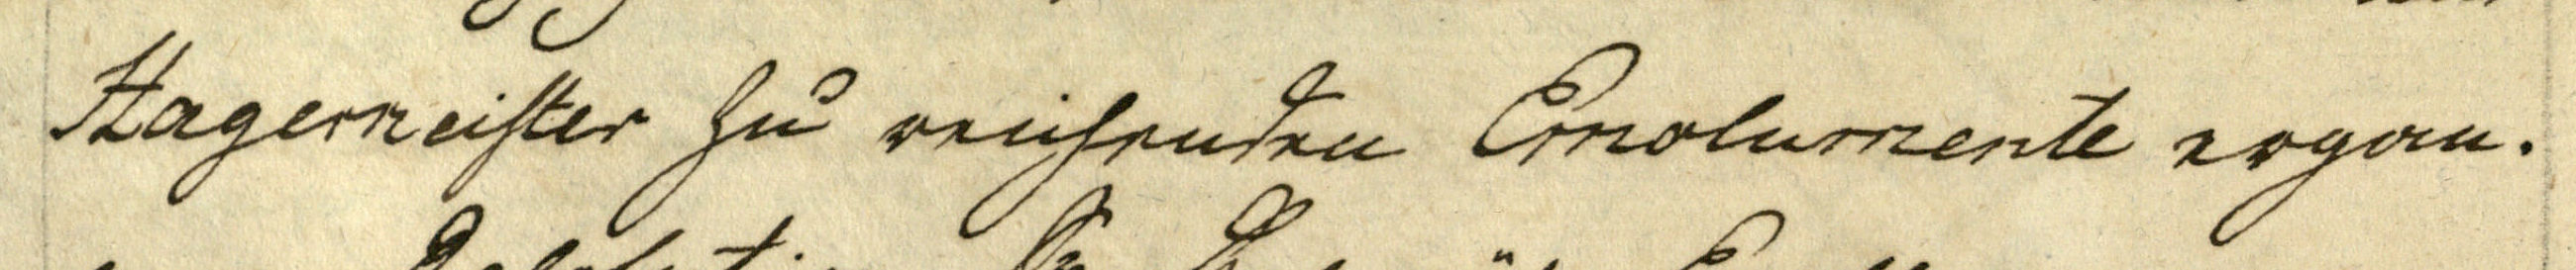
Hagemeister zu reichenden Emolumente ergan¬
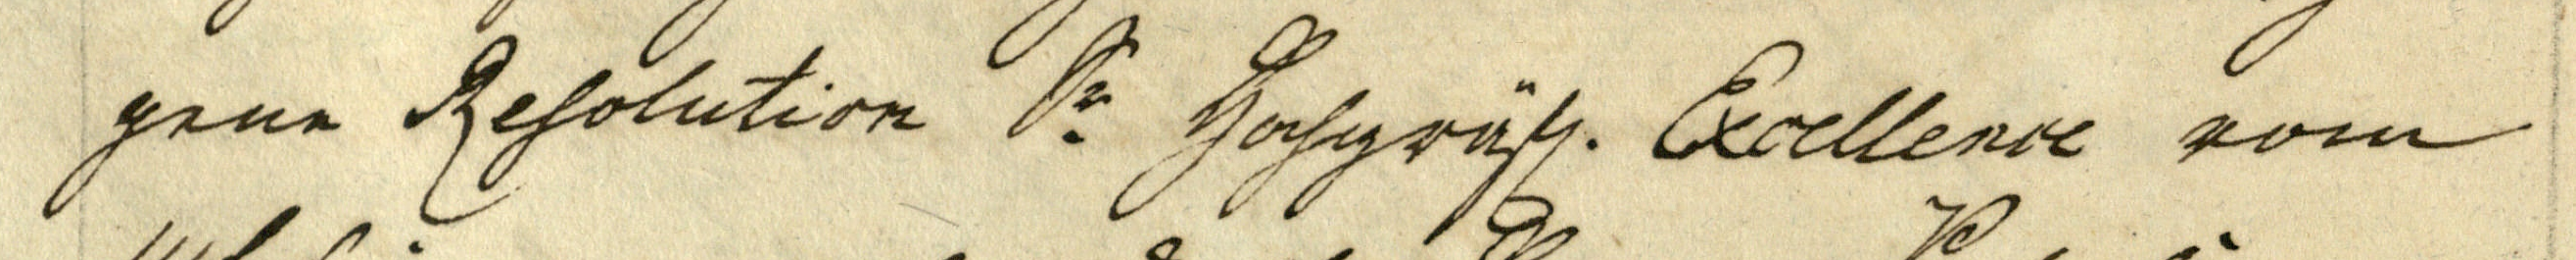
gene Resolution Sr Hochgräfl. Excellence vom
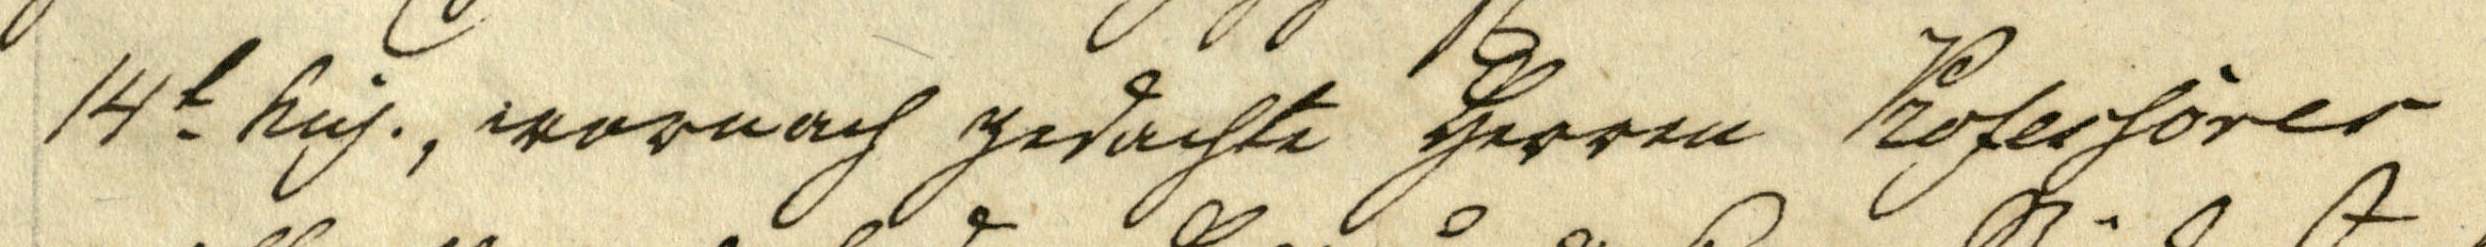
14. huj., wornach gedachte Herren Professores
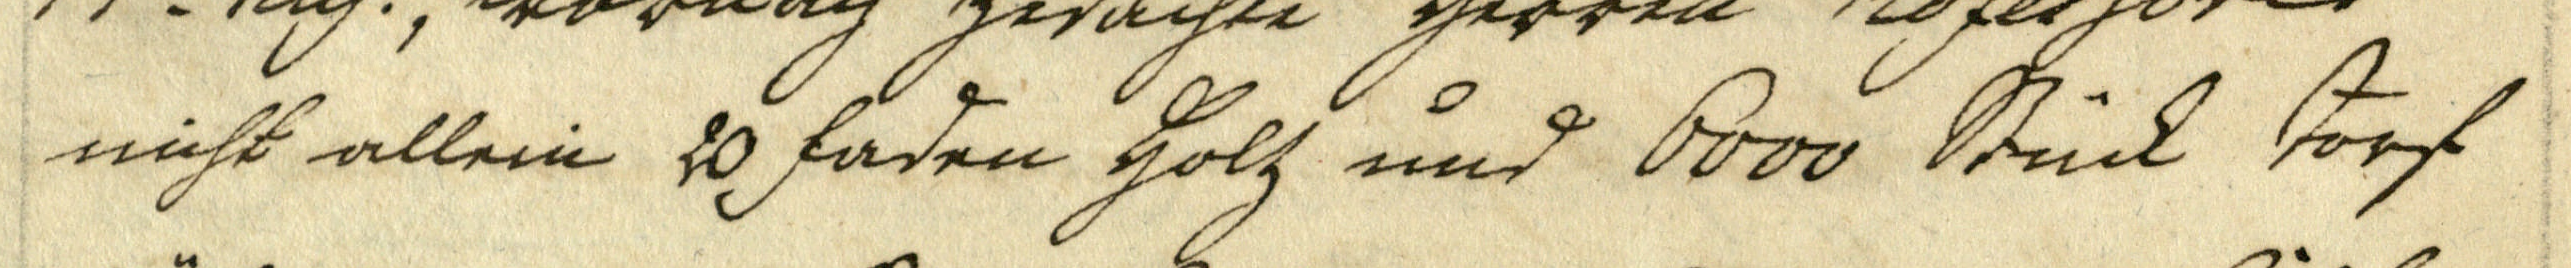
nicht allein 20 Faden Holz und 6000 Stück Torf
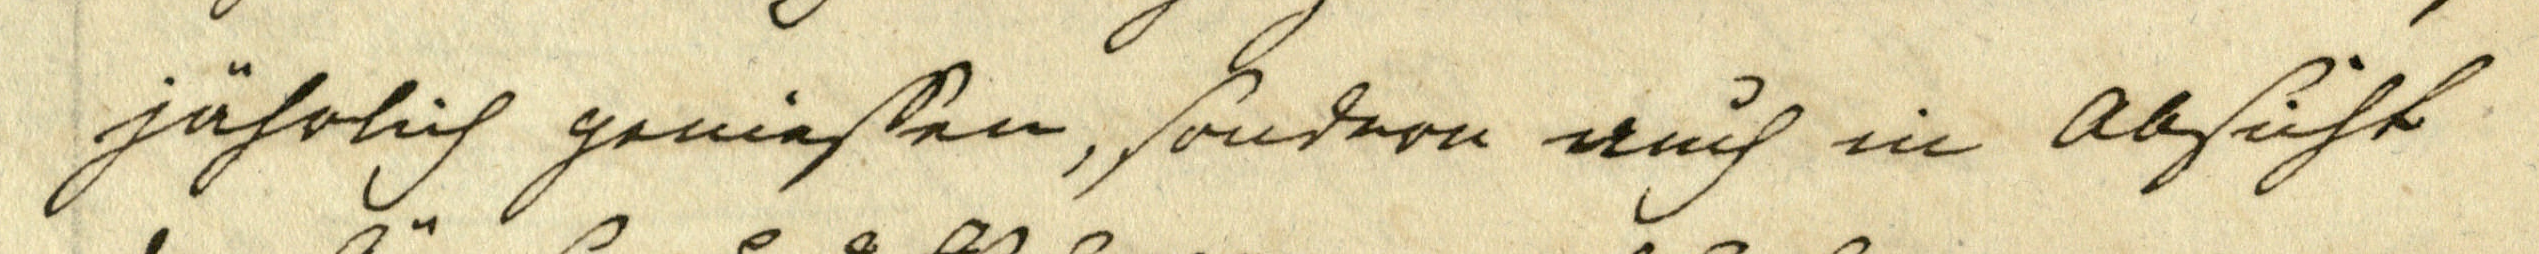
jährlich geniessen, sondern auch in Absicht
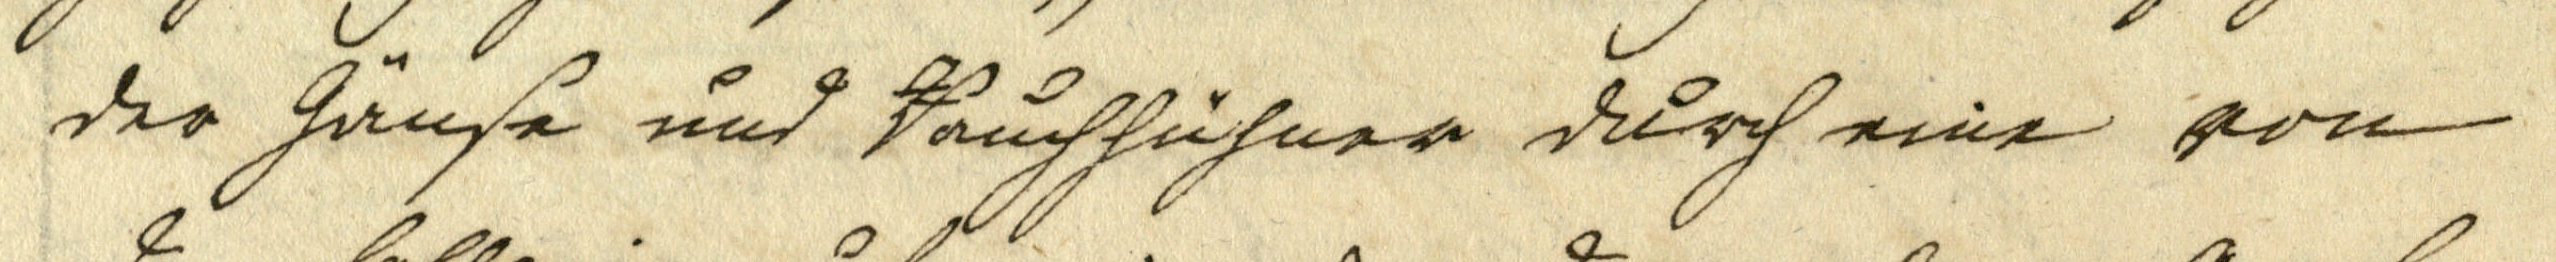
der Gänse und Rauchhühner durch eine von
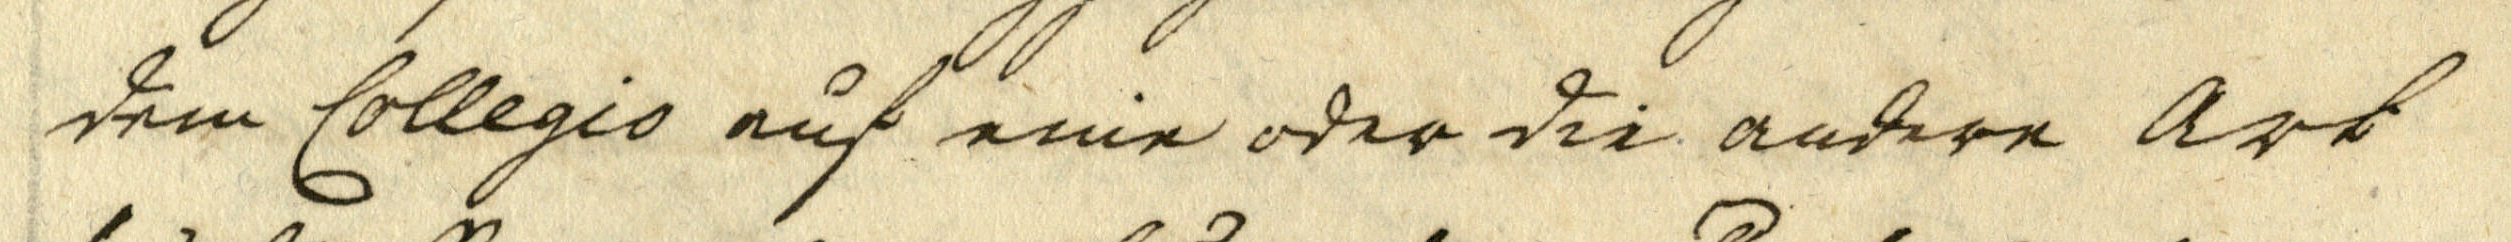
dem Collegio auf eine oder die andere Art
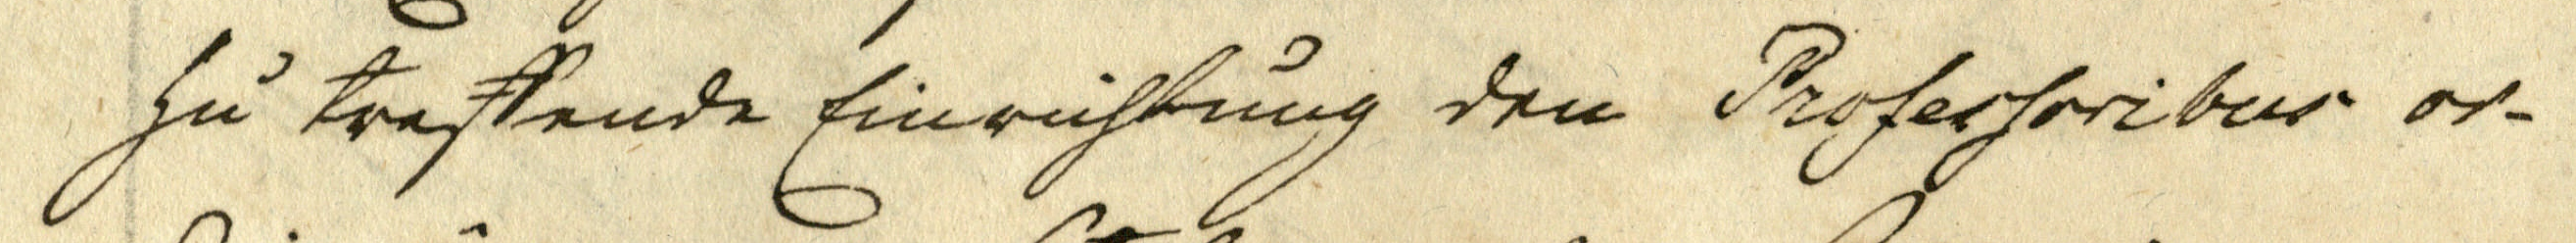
zu treffende Einrichtung den Professoribus or¬
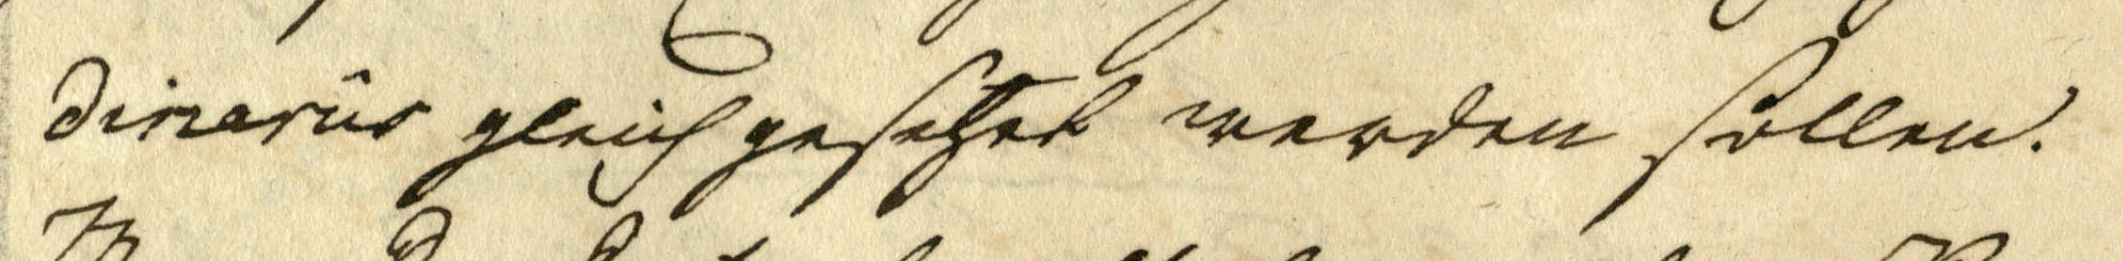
dinariis gleich gesetzet werden sollen.
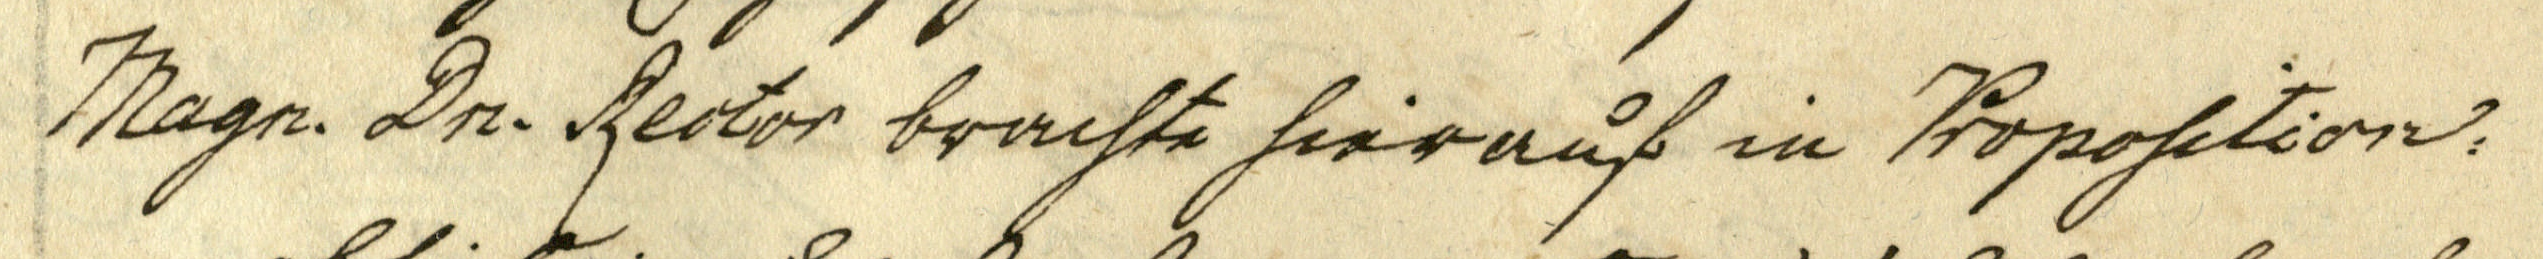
Magn. Dn. Rector brachte hierauf in Proposition:
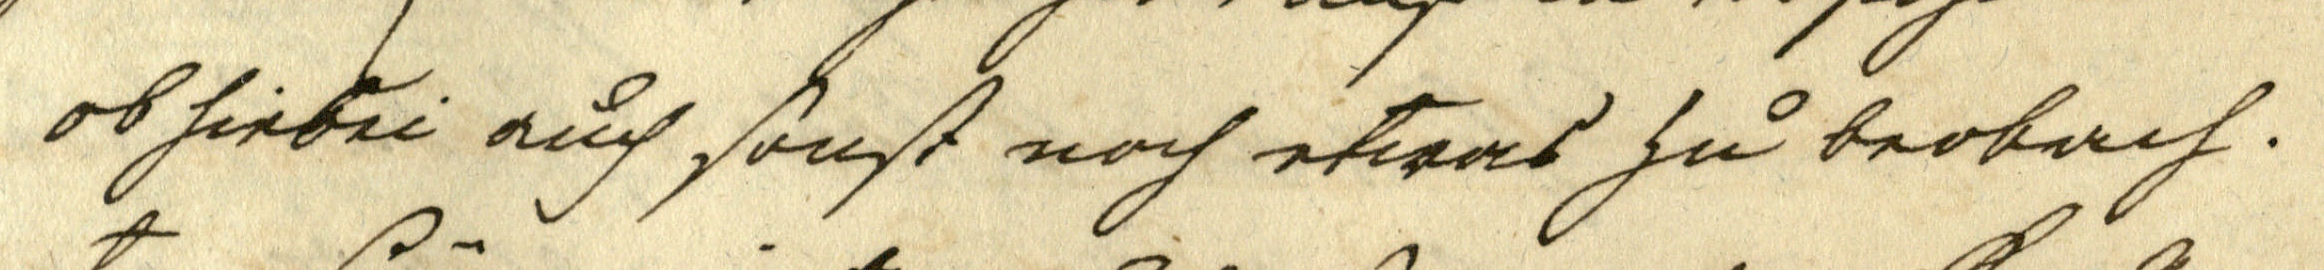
ob hiebei auch sonst noch etwas zu beobach¬
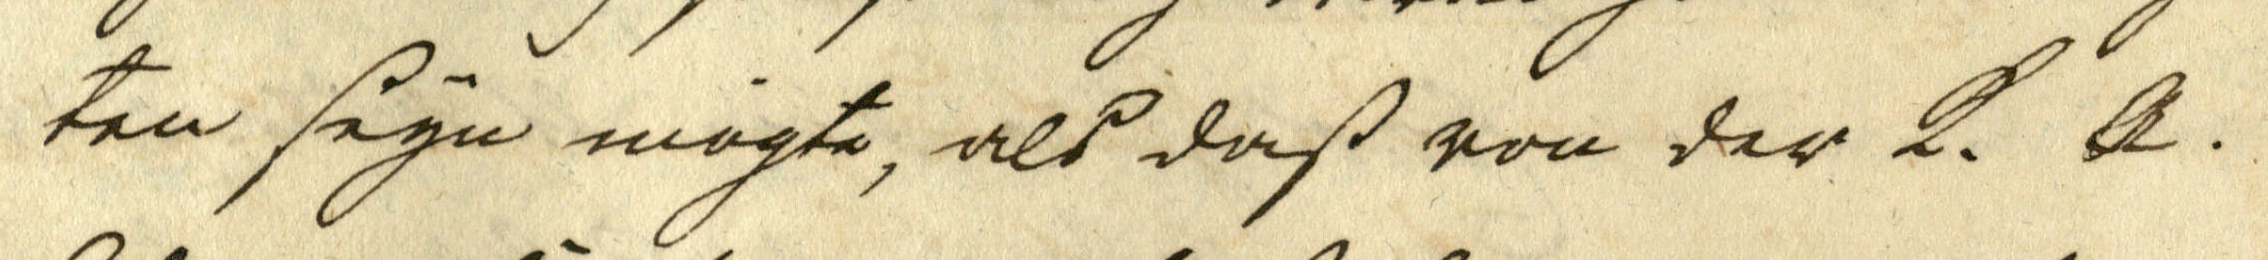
ten seÿn mögte, als daß von der K. A.
